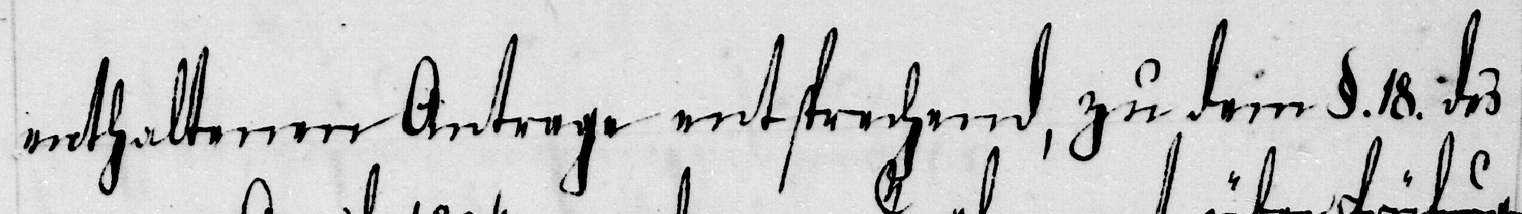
enthaltenen Antrage entsprechend, zu dem §. 18. d¬
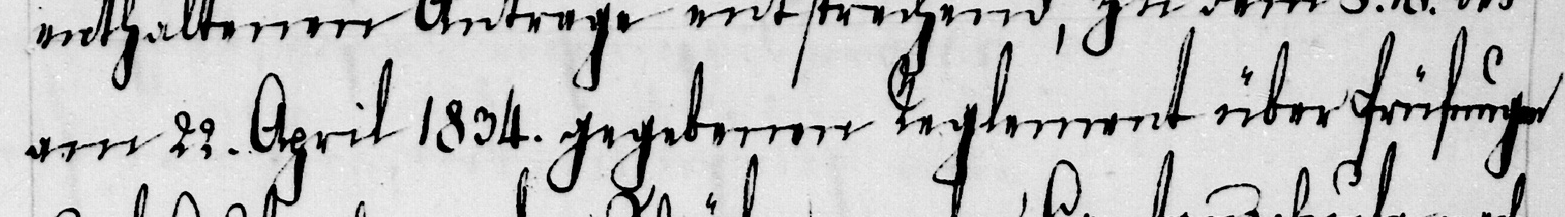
am 22. April 1834. gegebenen Reglement über Prüfungen
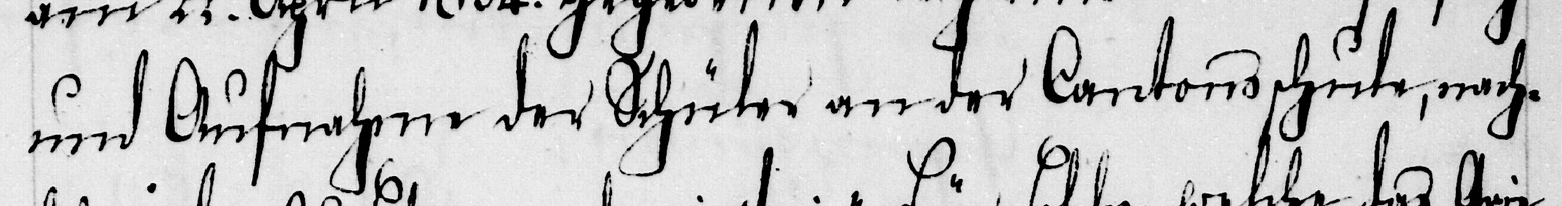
und Aufnahmen der Schüler an der Cantonsschule, nach¬
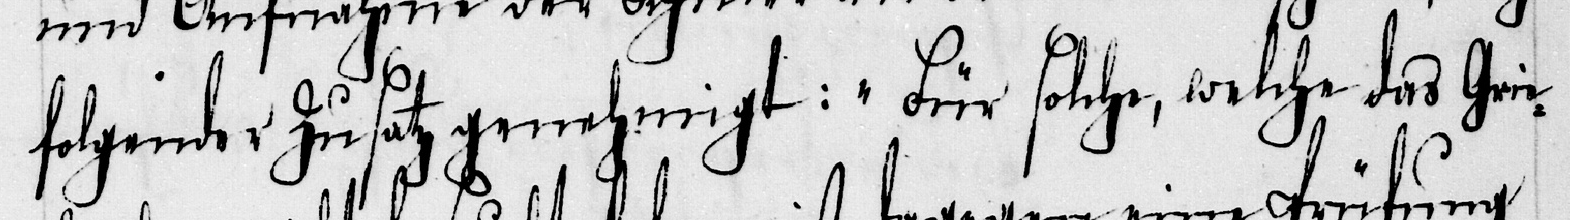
folgender Zusatz genehmigt: „Für solche, welche das Gri¬
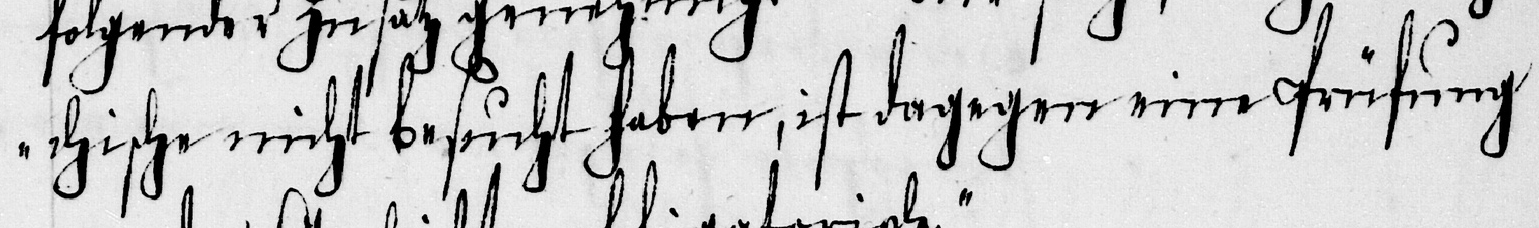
echische nicht besucht haben, ist dagegen eine Prüfung
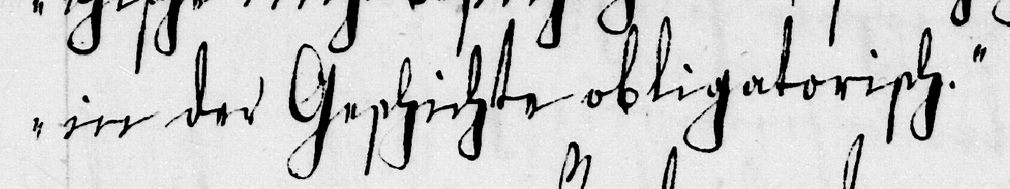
in der Geschichte obligatorisch.“
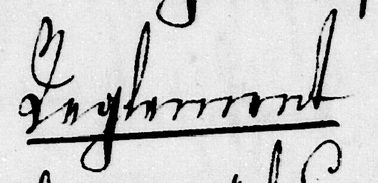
Reglement
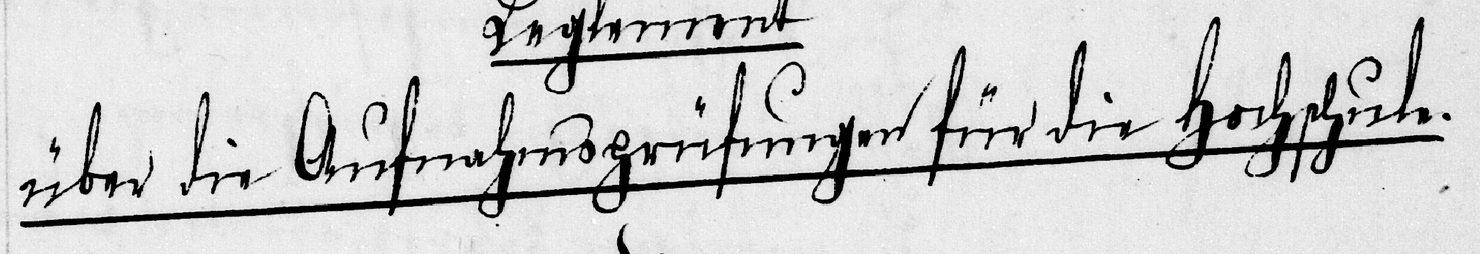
über die Aufnahmsprüfungen für die Hochschule.
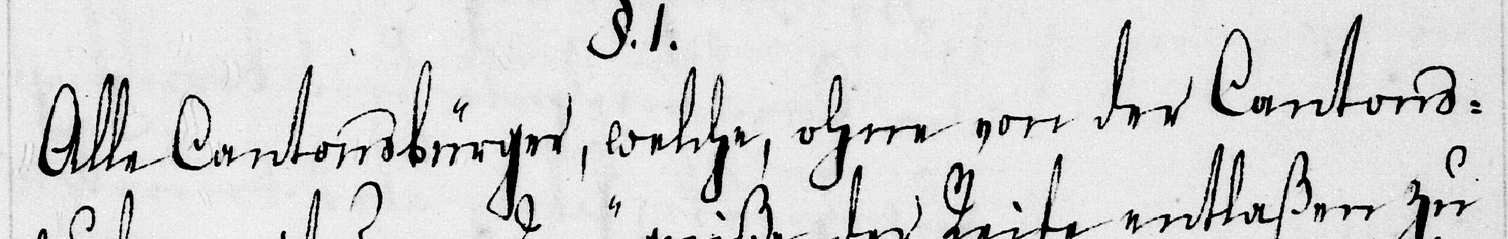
Alle Cantonsbürger, welche, ohne von der Cantons¬
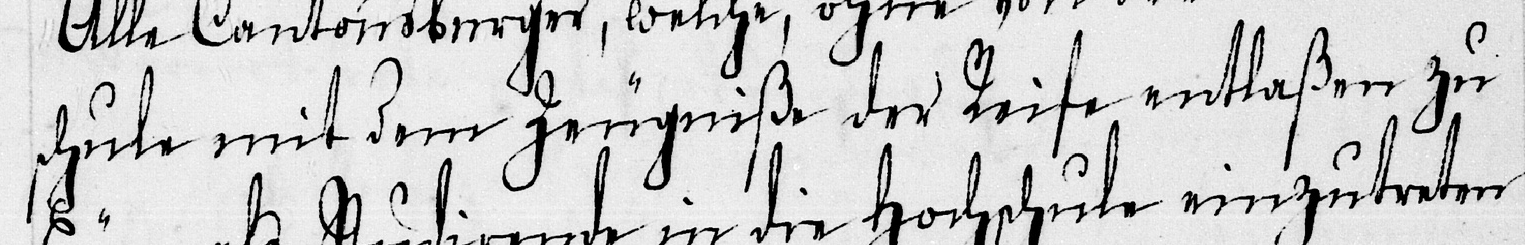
schule mit dem Zeugniße der Reife entlaßen zu
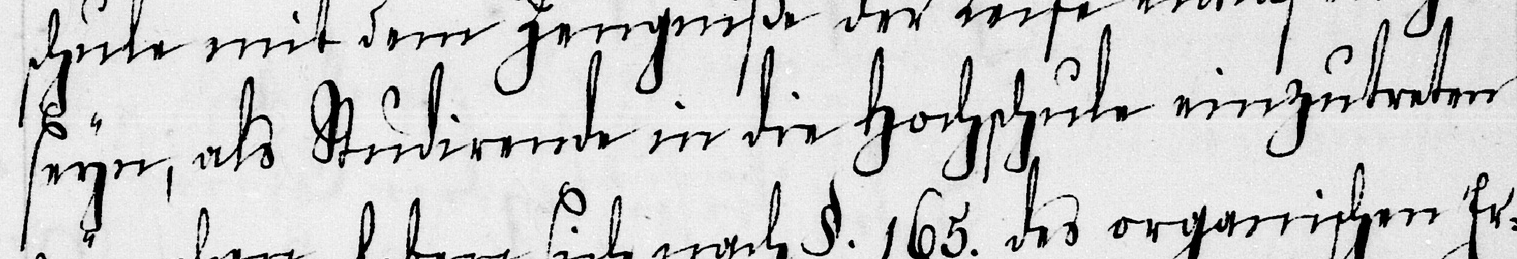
seyn, als Studirende in die Hochschule einzutreten
